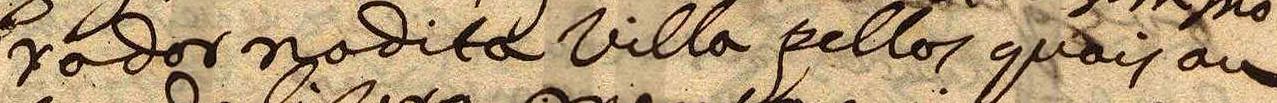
rador na dita villa pellos quais au
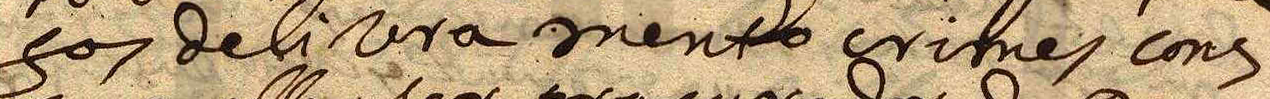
tos de livramento crimes cons
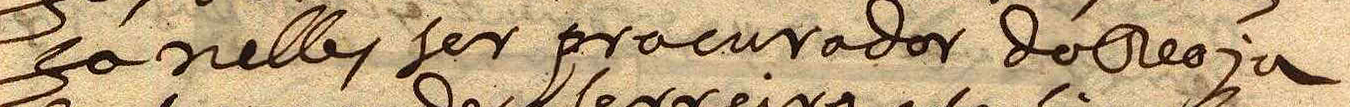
ta nelles ser procurador do Reo ju
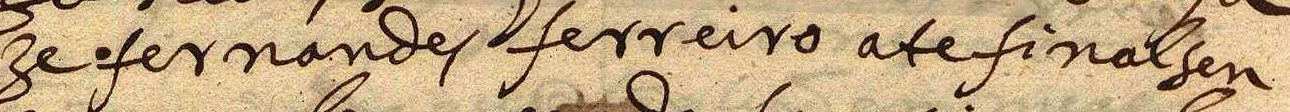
ze fernandes ferreiro ate final sen
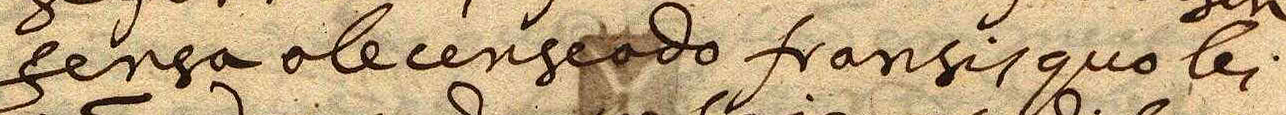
tensa o lecenseado fransisquo lei
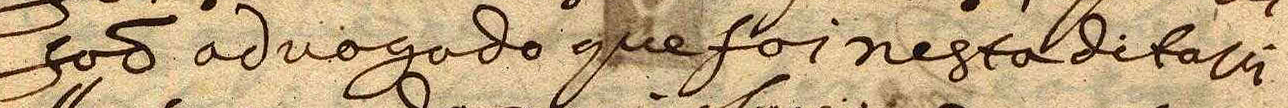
taõ aduogado que foi nesta dita vi
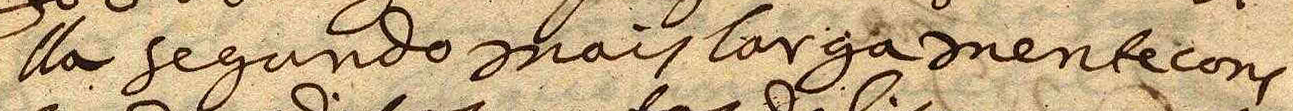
lla segundo mais largamente cons
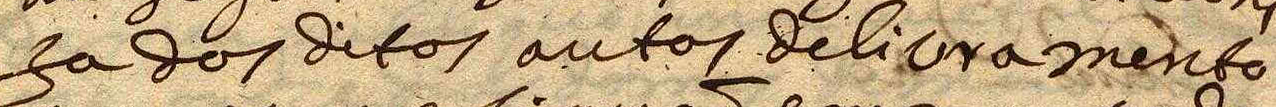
ta dos ditos autos de liuramento
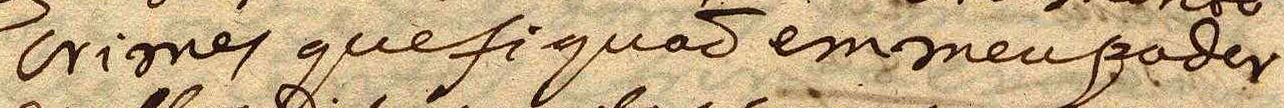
crimes que fiquaõ em meu poder
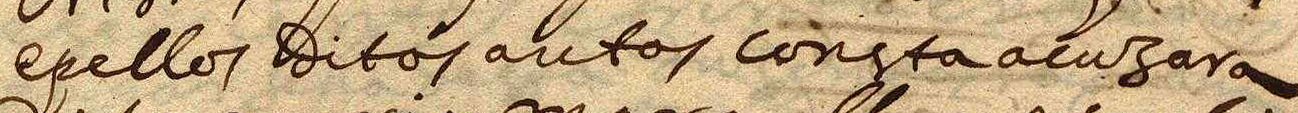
e pellos ditos autos consta acuzar a
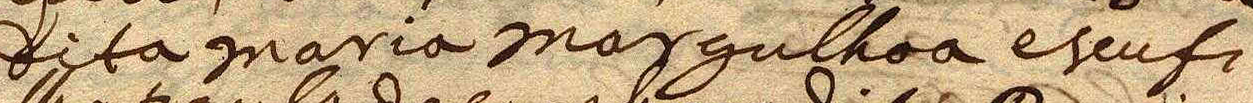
dita maria margulhoa e seu fi
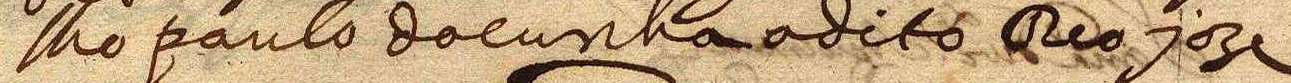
lho paulo da cunha o dito Reo joze
